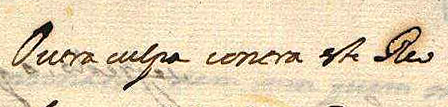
Outra culpa contra este Reo
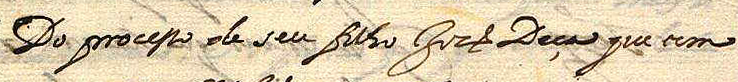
Do processo de seu filho Joaõ Deça que tem
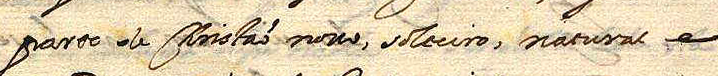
parte de Christaõ nouo, solteiro, natural e
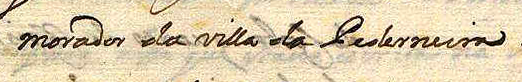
morador da villa da Pederneira
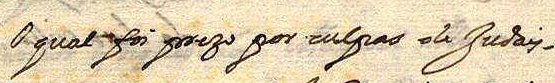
O qual foi prezo por culpas de Judais
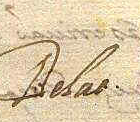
Delat.
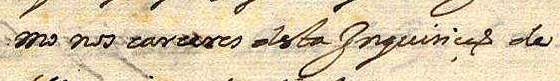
mo nos carceres desta Jnquisiçaõ de
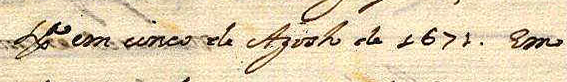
Lxa em cinco de Agosto de 1671. Em
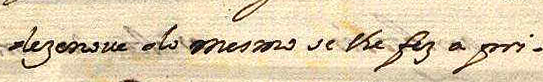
dezenoue do mesmo se lhe fez a pri
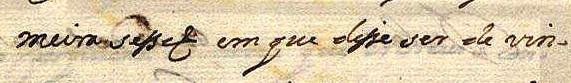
meira sessaõ em que disse ser de vin
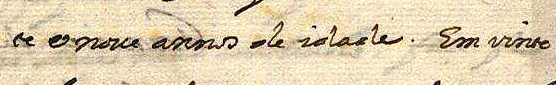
te e noue annos de idade. Em vinte
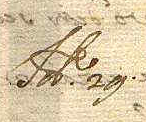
Id.e 29.
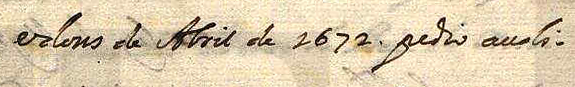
e dous de Abril de 1672. pedio audi
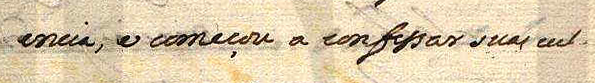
encia, e começou a confessar suas cul
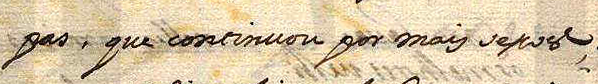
pas, que continuou por mais sessoẽs,
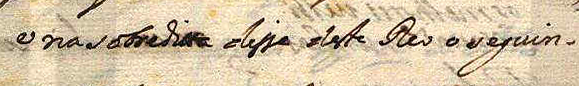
e na sobreditta disse deste Reo o seguin
